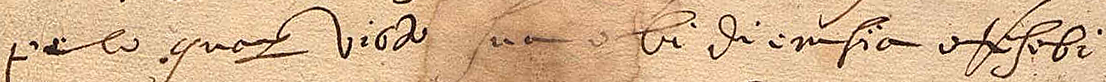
pelo qual visto sua obidiemsia o Resebi
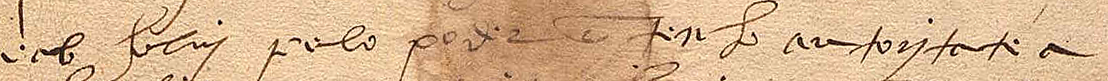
a absoluj pelo poder q̄ tenho autorjtate a
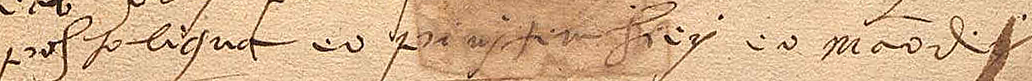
postoliqua e o pinjtemsiey e o mãodey
